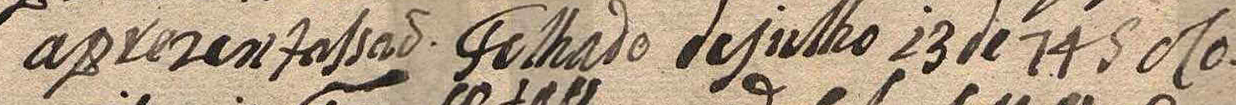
aprezentassaõ. Telhado de julho i3 de 745 o Co
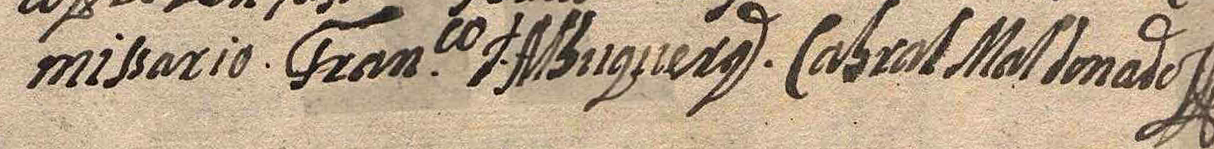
missario. Fran.co d̄.Albuquerq̄ Cabral Maldonado
